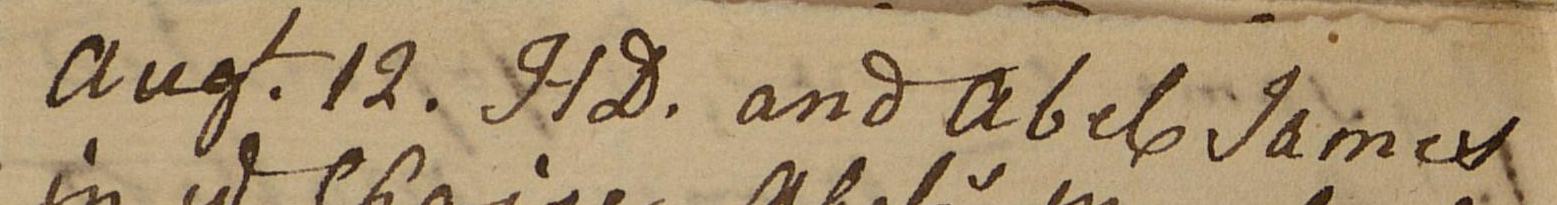Aug^t. 12. HD. and Abel James
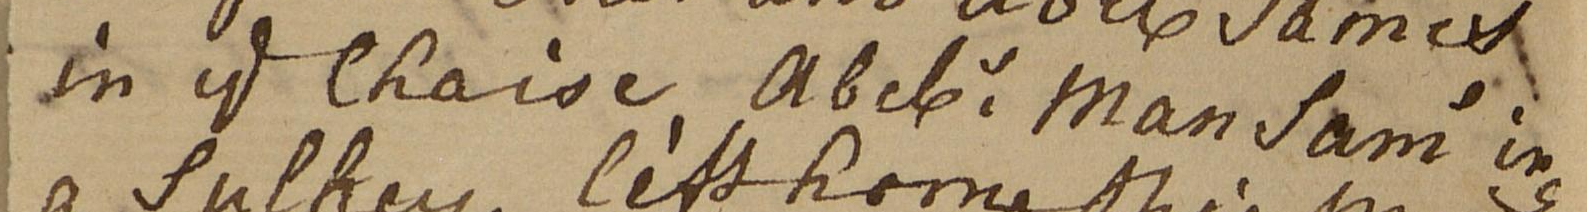in y^e Chaise Abel^s. Man Sam^l ing
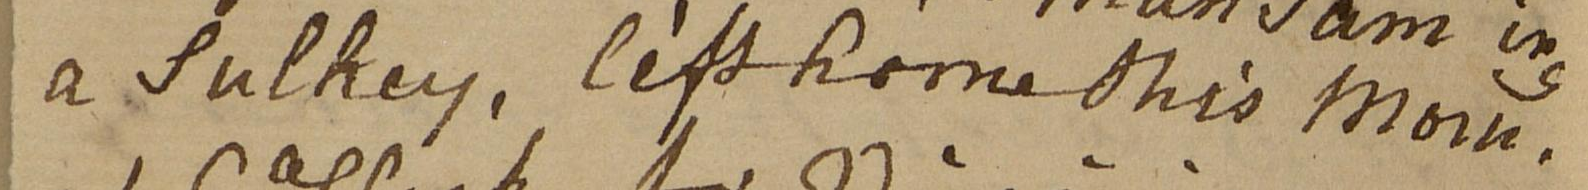a Sulkey, lifs home this morn^g.
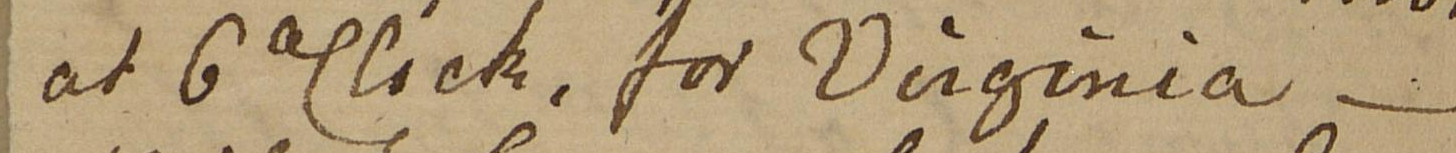at 6 ^o Clock, for Virginia-
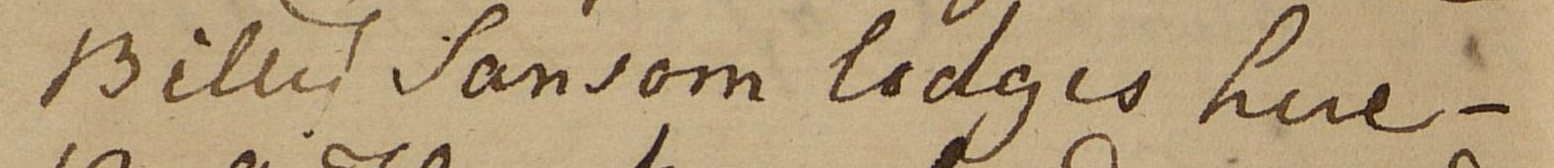Billy Sansom lodges here-
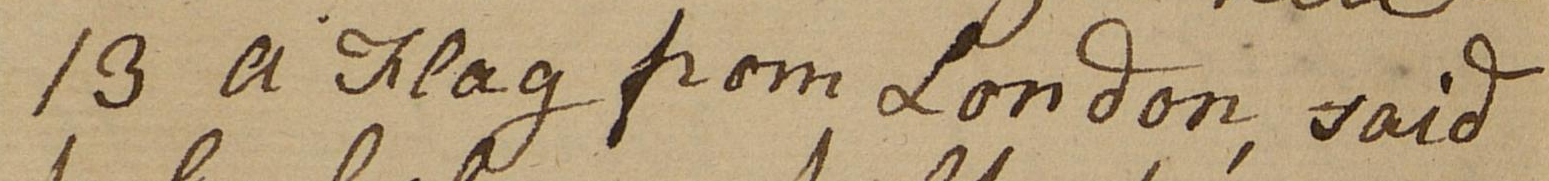13 A Flag from London, said
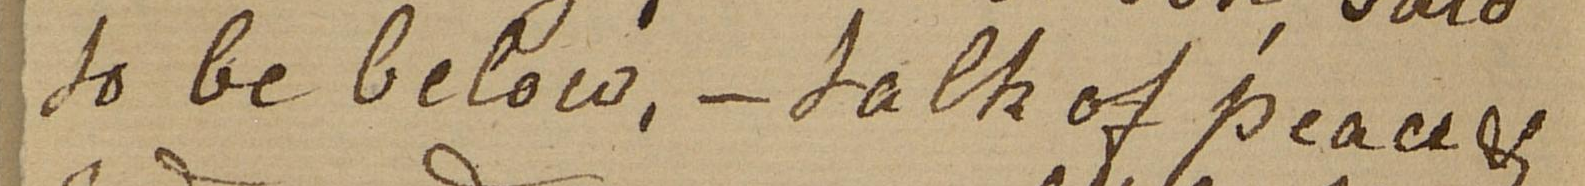to be below,- talk of peace &
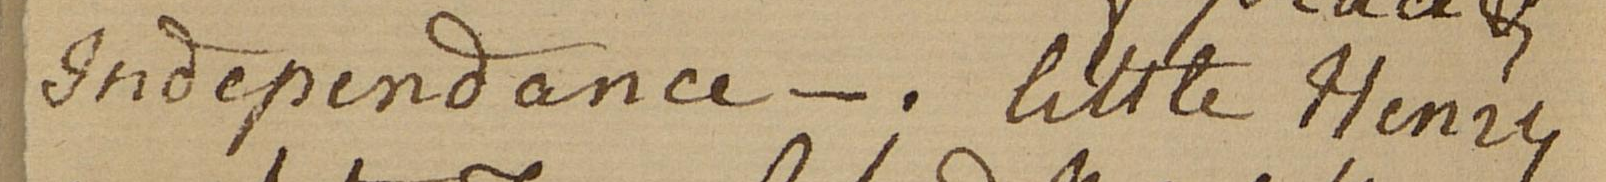Independance-. little Henry
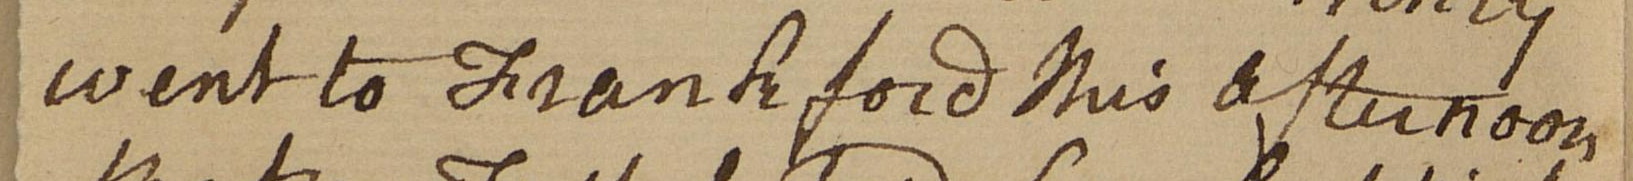went to Frank ford this afternoon
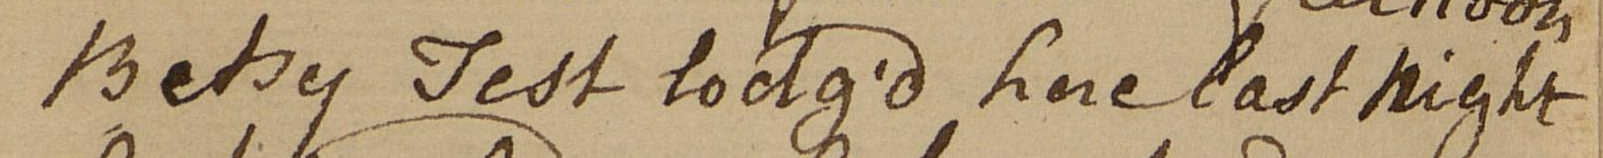Betsy Test lodg'd here last night
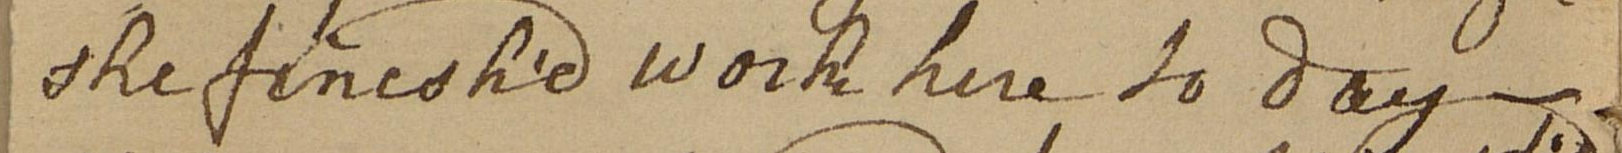she finish'd work here to day-
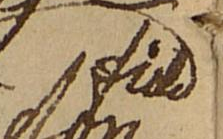field
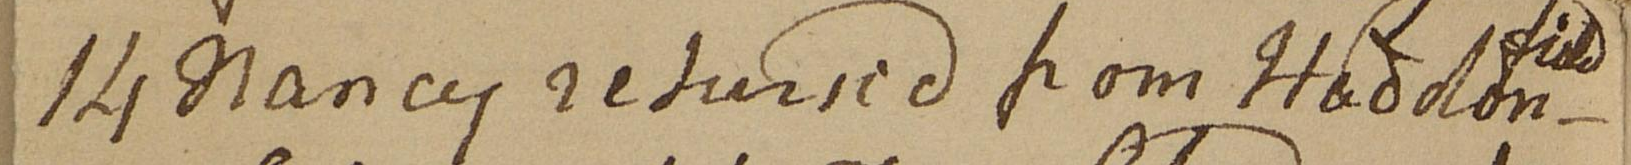14 Nancy return'd from Haddon-
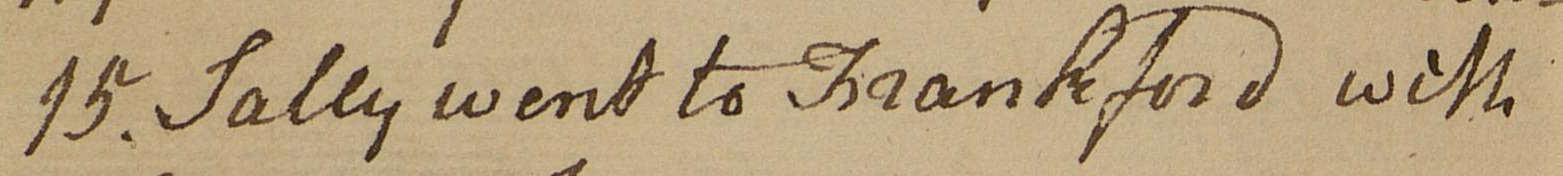15. Sally went to Frankford with
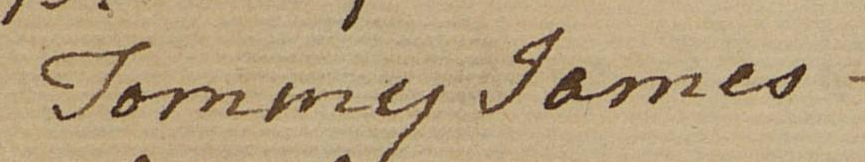Tommy James
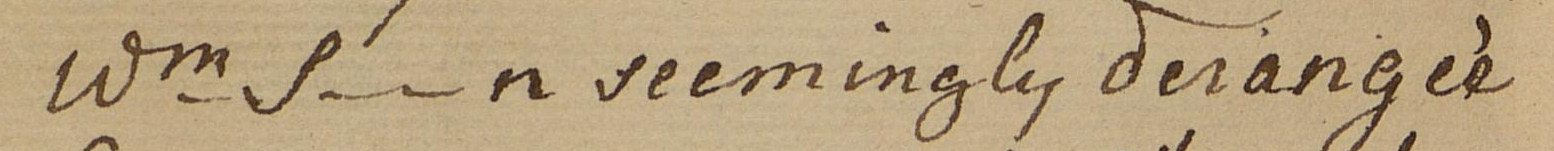W^m S- n seemingly derange[d]
